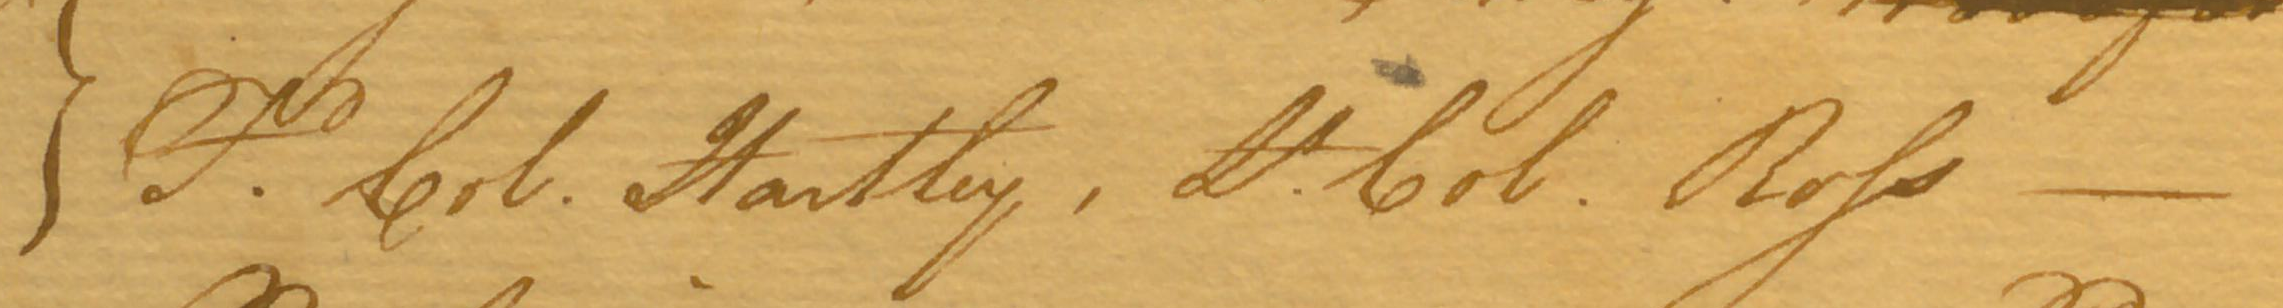F^d. Col. Hartley, L^t. Col. Ross-
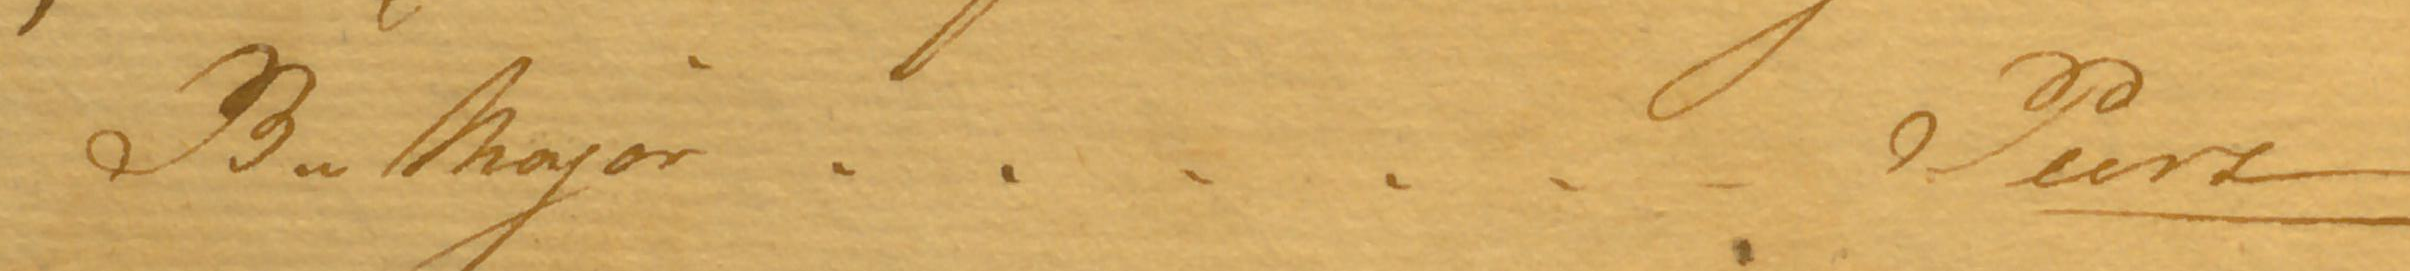B. Major ...... Piers
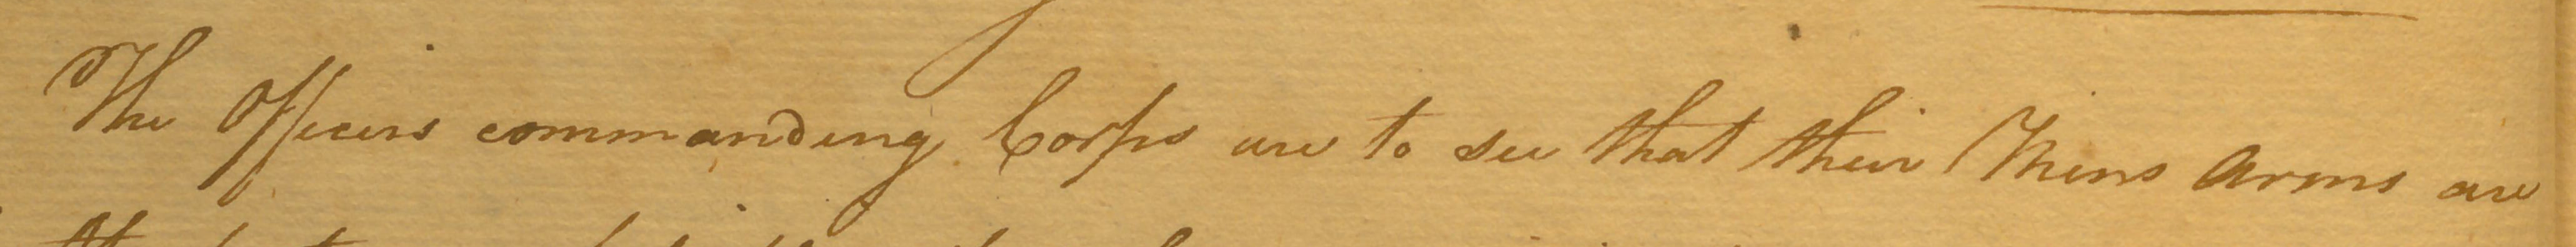The Officers commanding Corps are to see that their Mens arms are
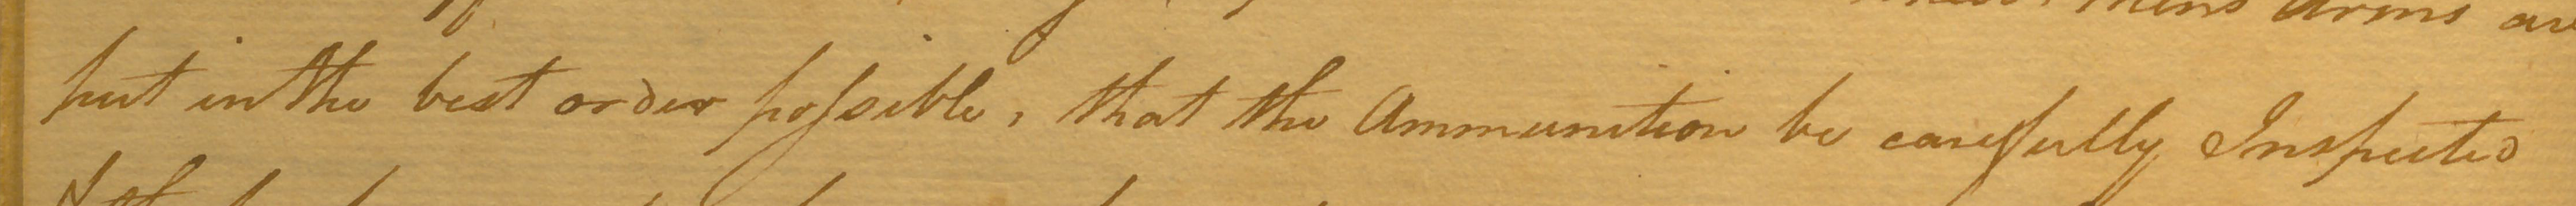but in the best order possible, that the Ammunition be carefully Inspected
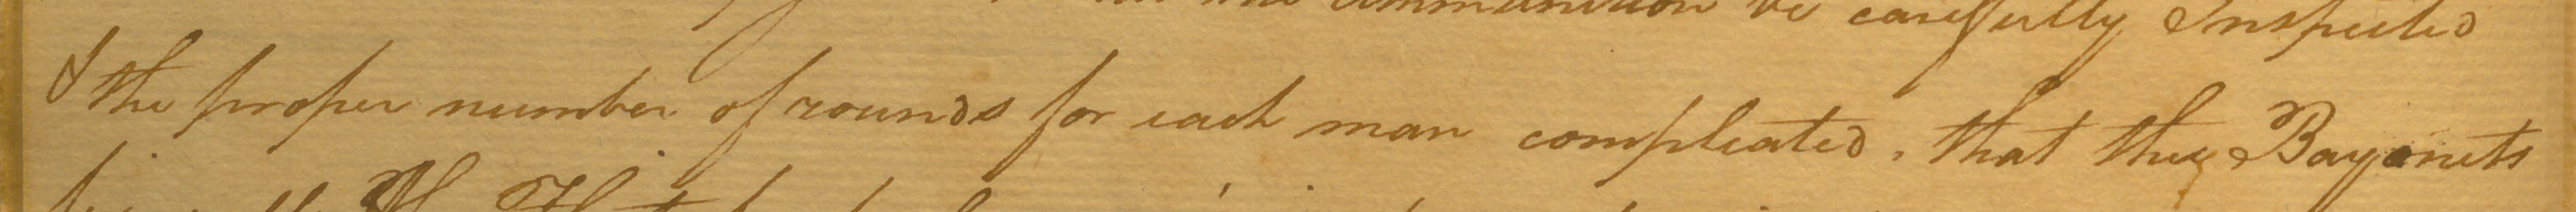& the proper number of rounds for each man compleated, that these Bayonets
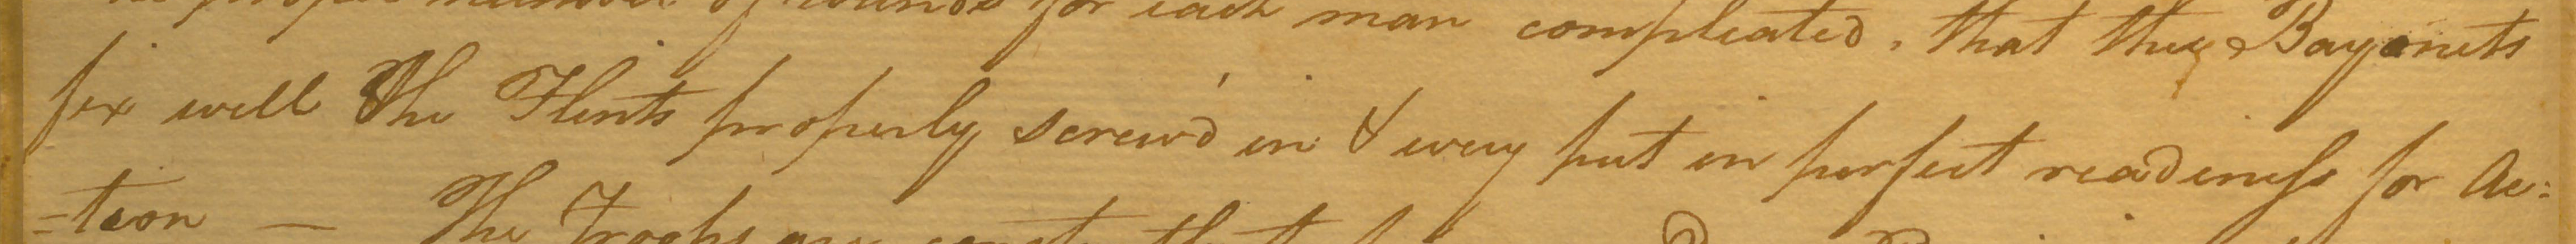fix well the Flints properly screw'd in & every put in perfect readiness for Ac-
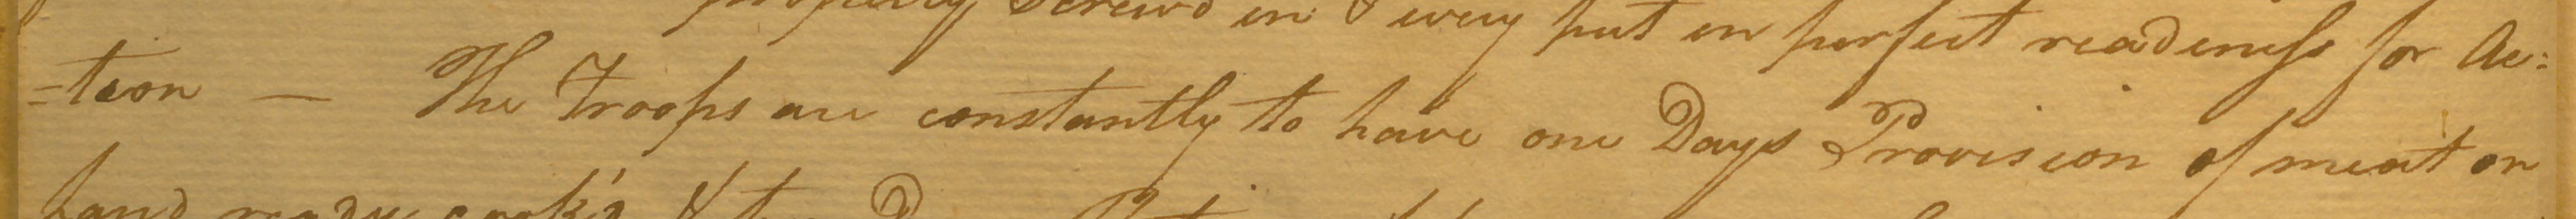-tion- The Troops are constantly to have one Days Provisions of meat on
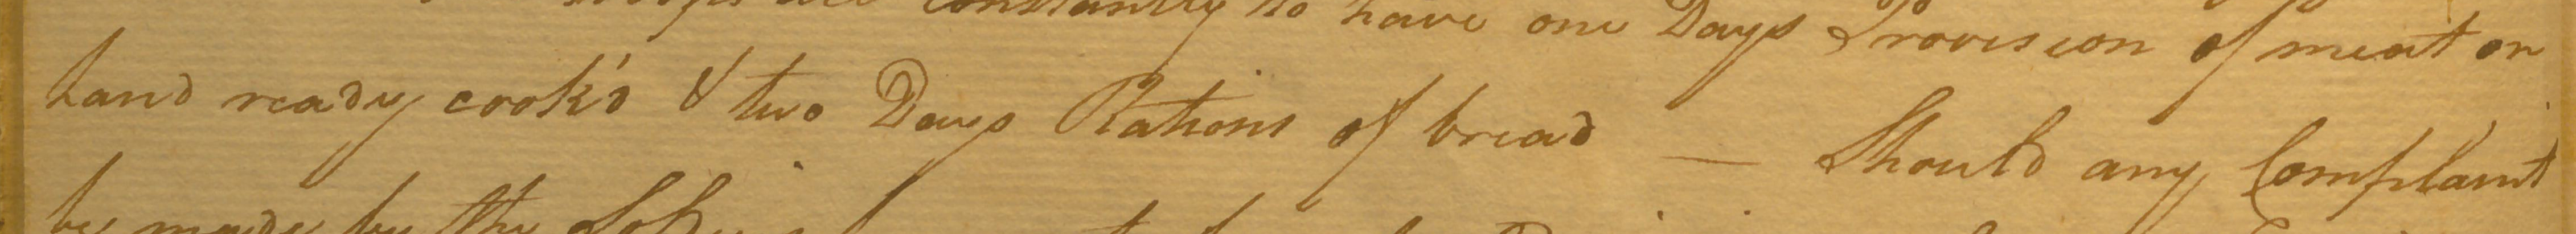Land ready cook'd & two Days Rations of bread- Should any Complaint
